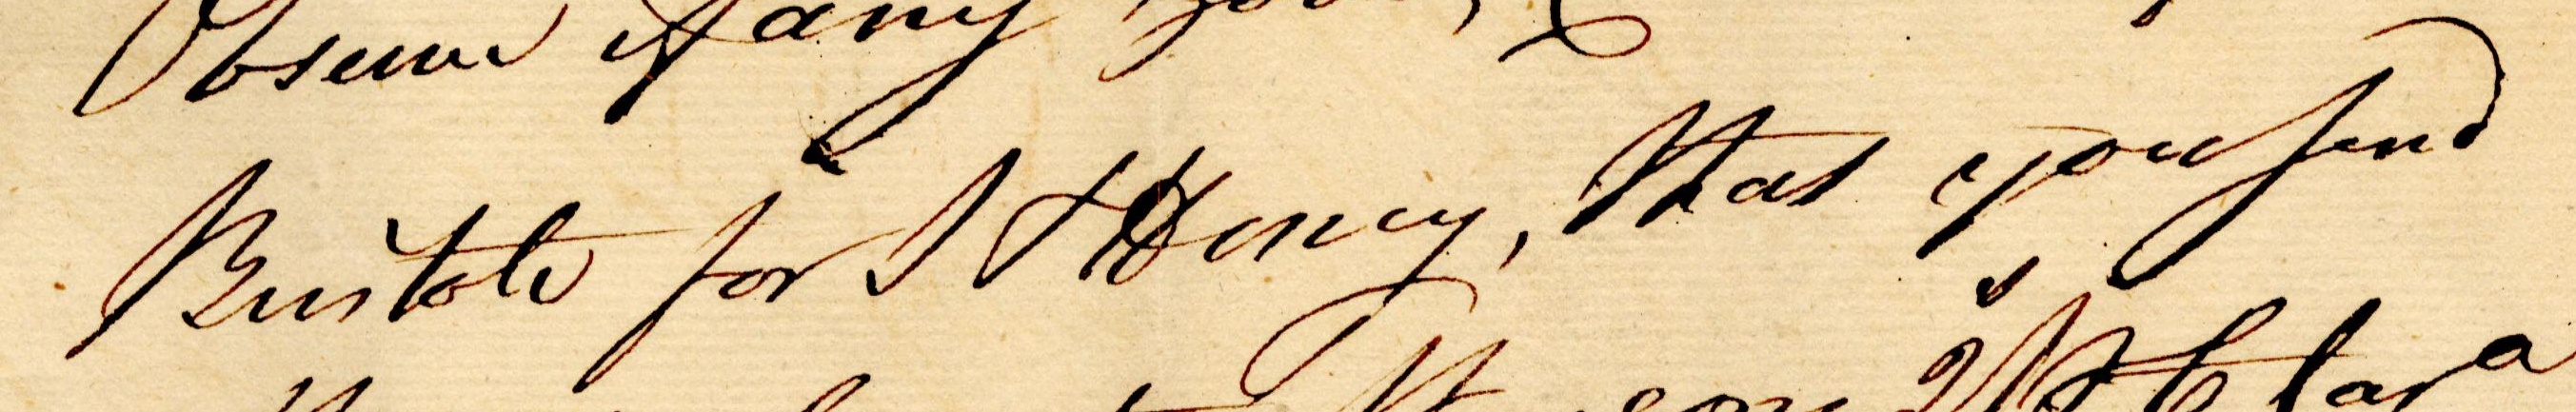Bristole for J S Henry, that you send
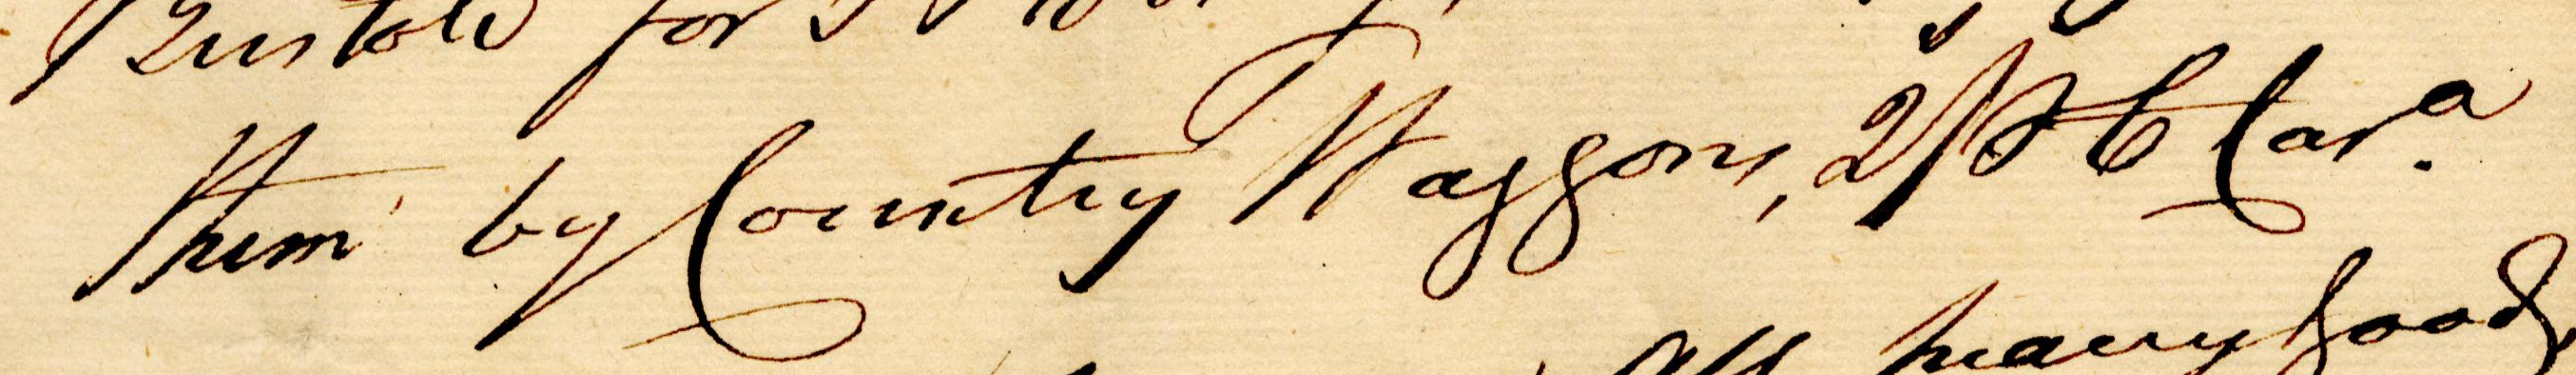them by Country Waggon, 2 per C Car^a.
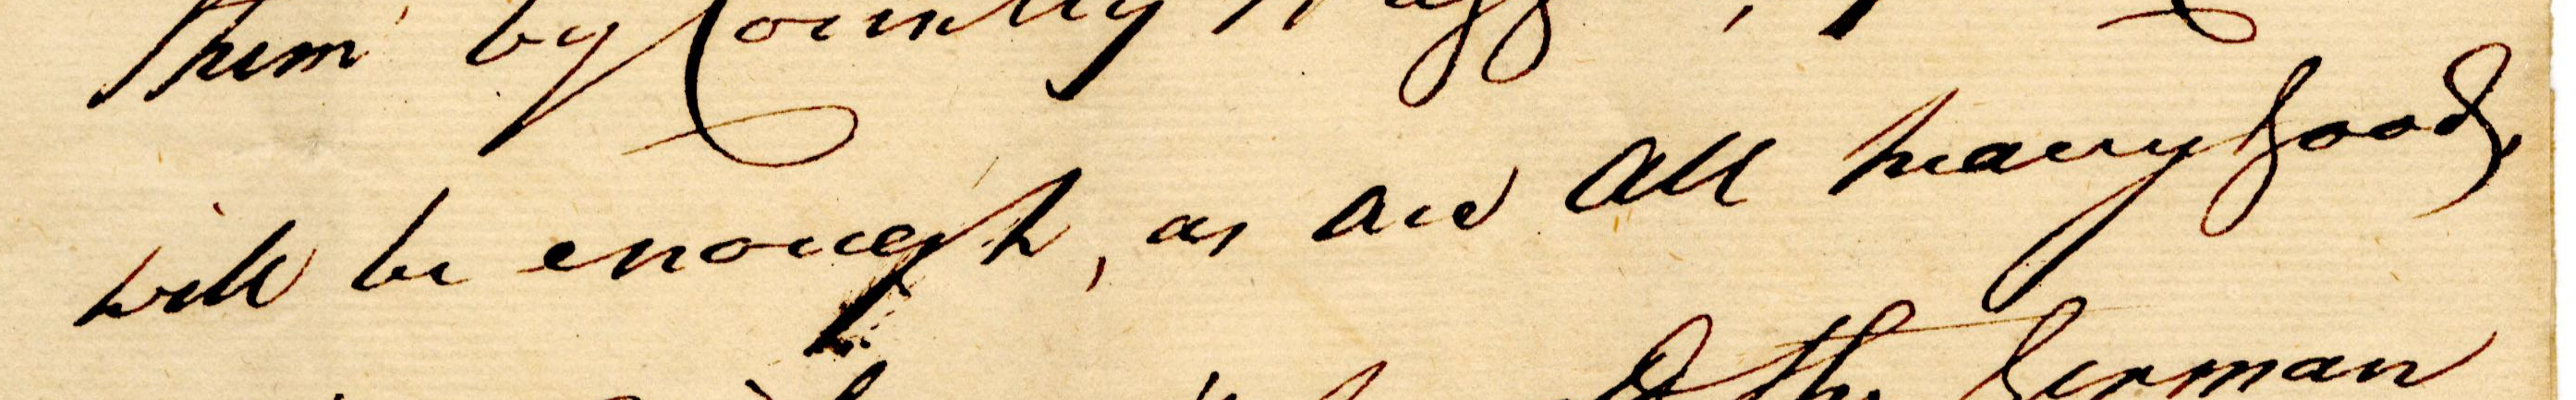will be enough, as are All heavy goods
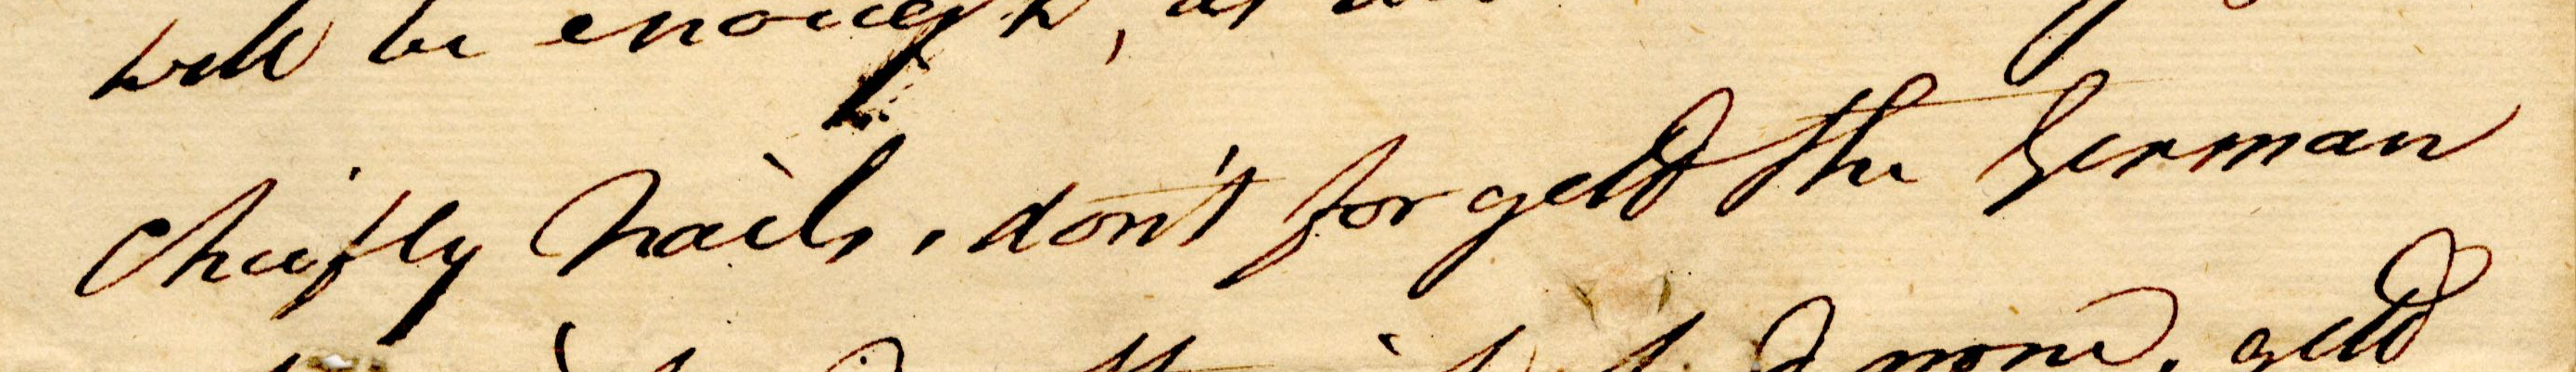cheifly nails, don't forgetd the German
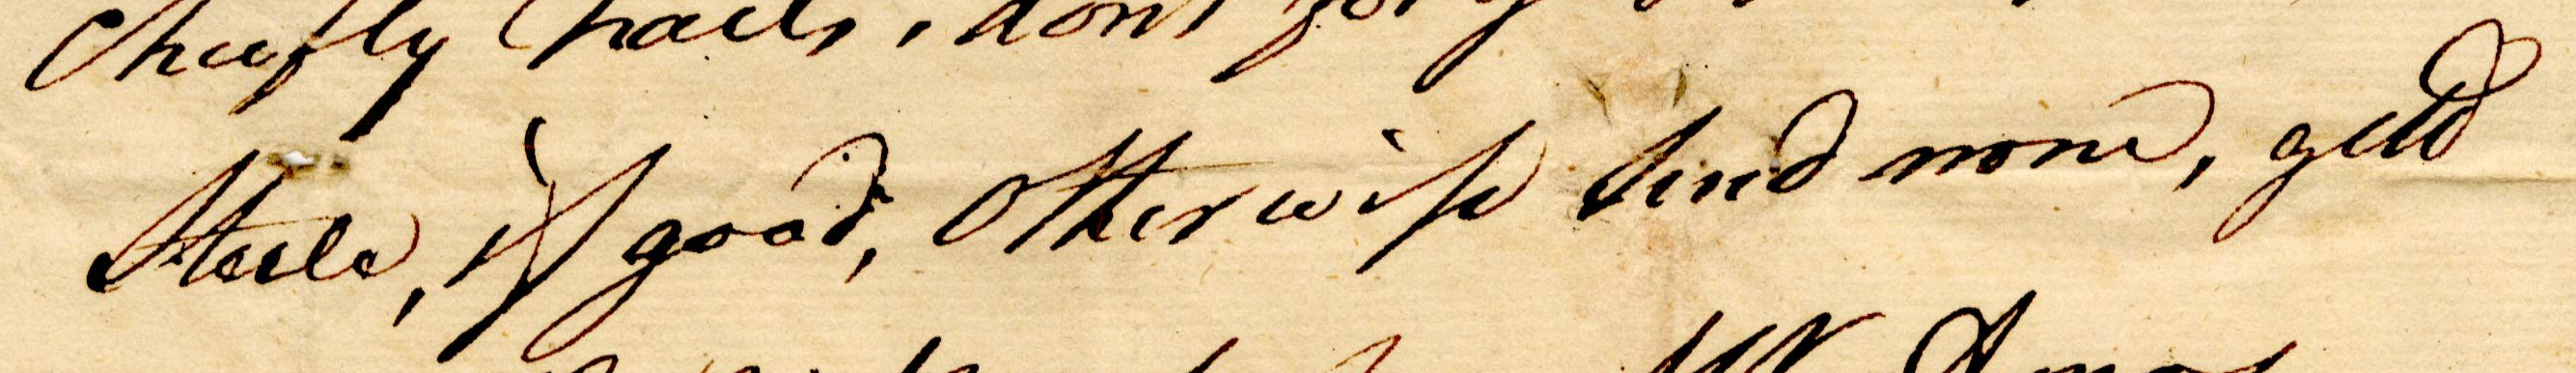Steele, if good, otherwise send more, getd
